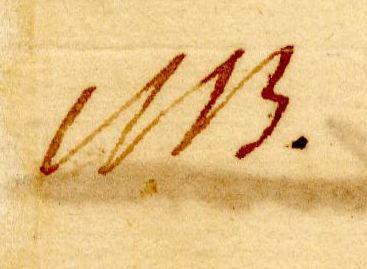NB.
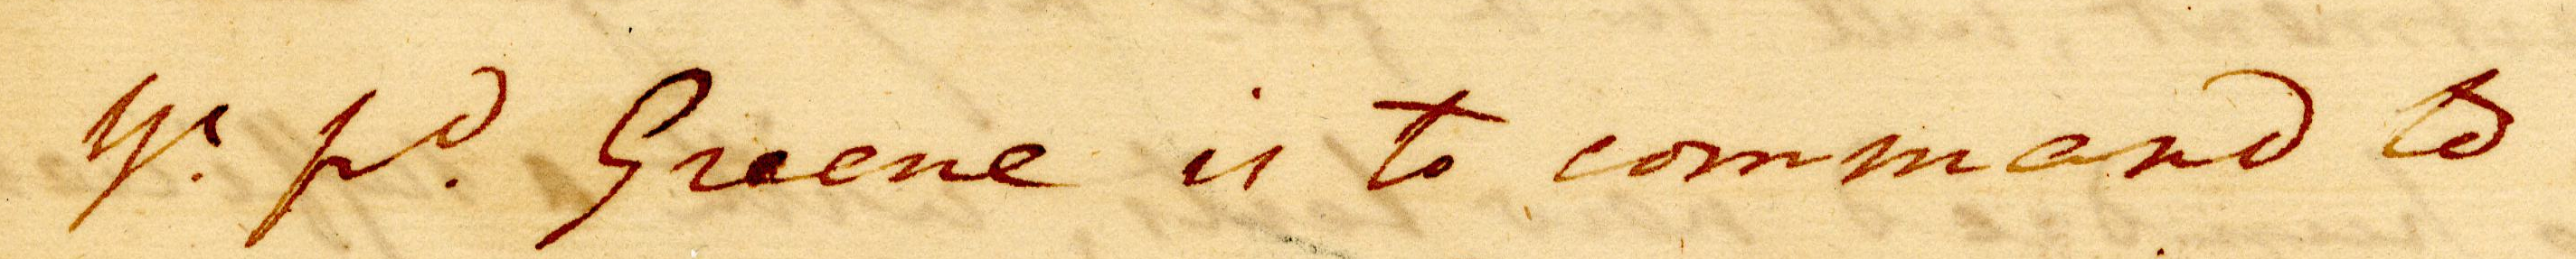Y^r. fr^d. Greene is to command to
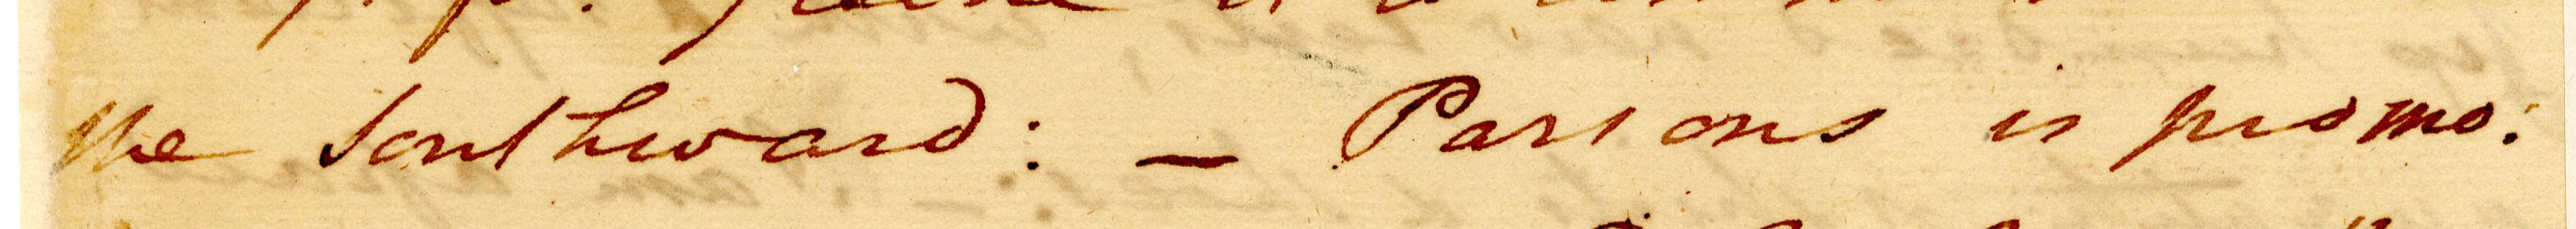the Southward:- Parsons is promo-
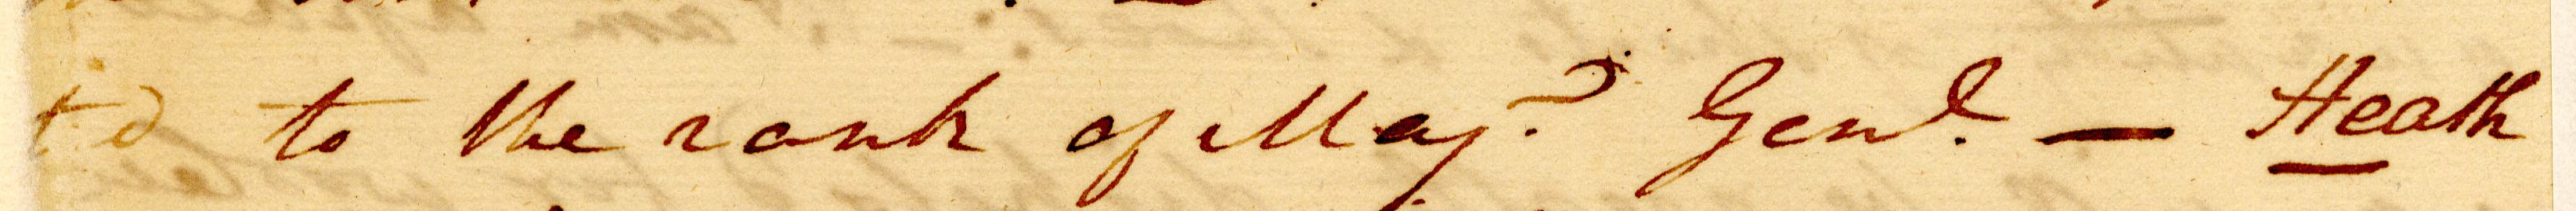td to the rank of Maj^r. Gen^l.- Heath
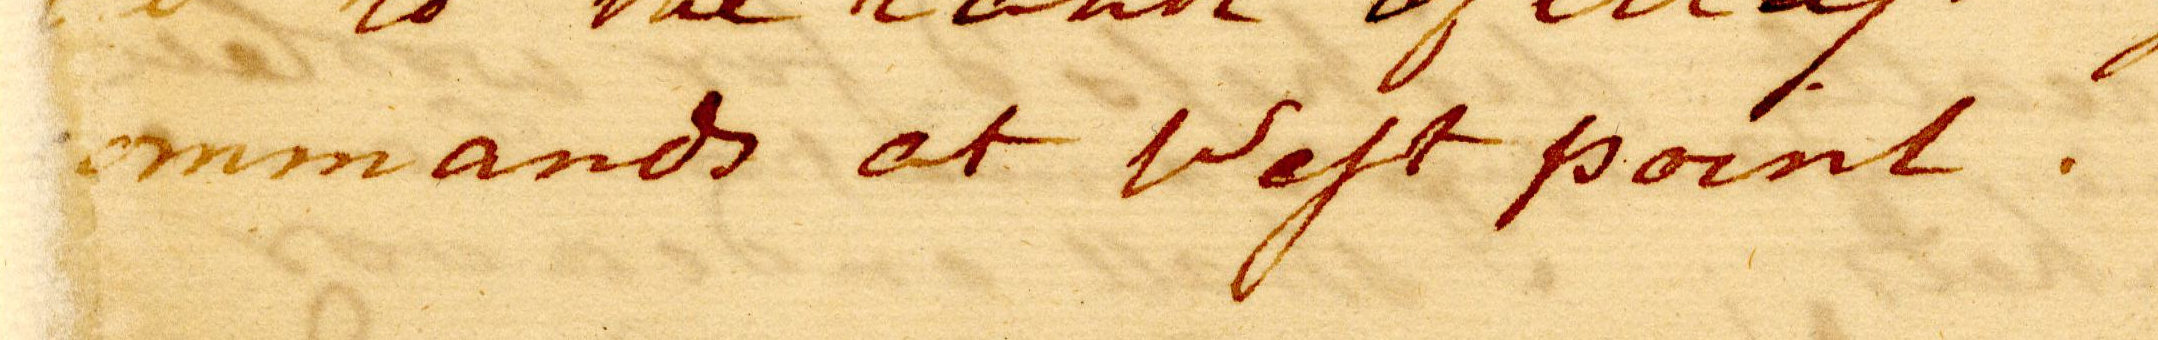commands at West Point.
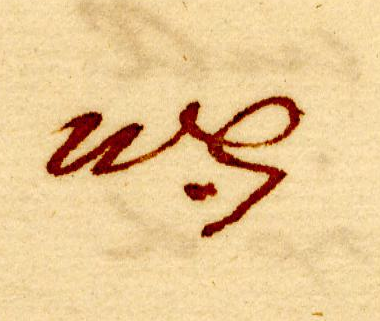W.G
